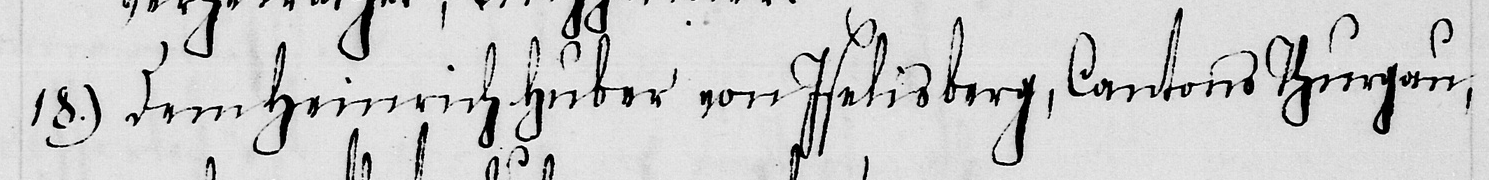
18.) Dem Heinrich Huber von Iselisberg Cantons Thurgau,
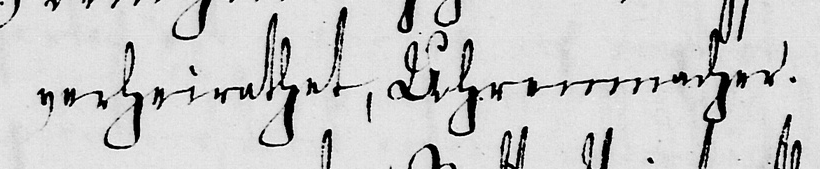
verheirathet, Uhrenmacher.
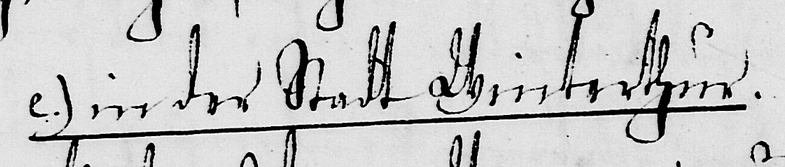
e.) in der Stadt Winterthur.
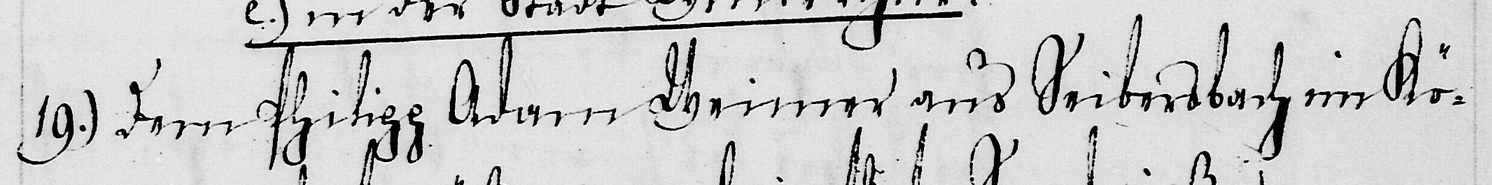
19.) Dem Philipp Adam Weimer aus Seibersbach im Kö¬
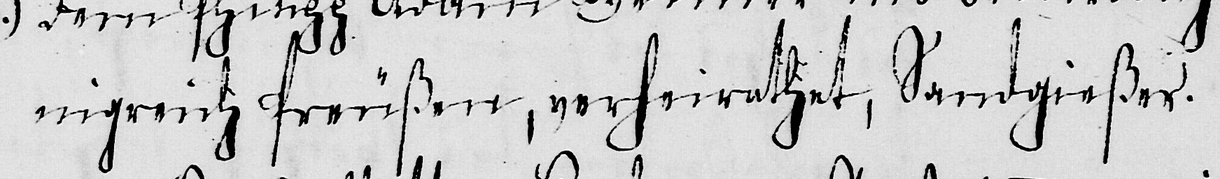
nigreich Preußen, verheirathet, Sandgießer.
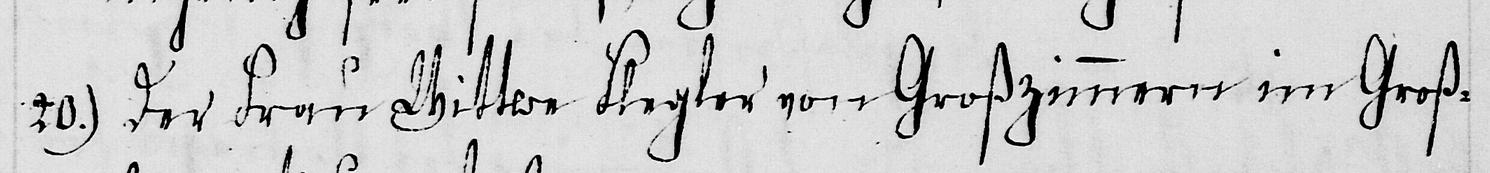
20.) Der Frau Wittwe Flegler von Großzimmern im Groß¬
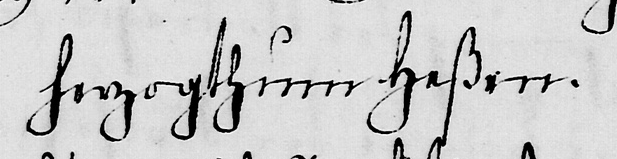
herzogthum Heßen.
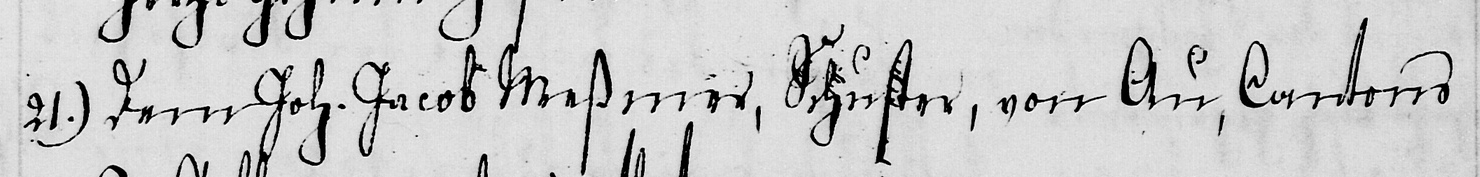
21.) Dem Joh. Jacob Meßmer, Schuster, von Au, Cantons
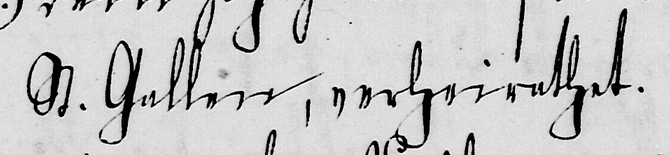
St. Gallen, verheirathet.
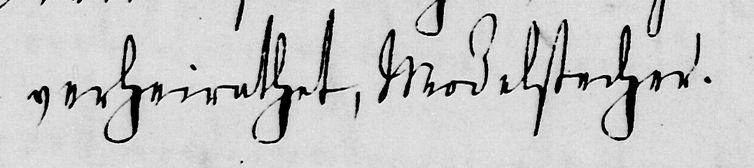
verheirathet, Modelstecher.
